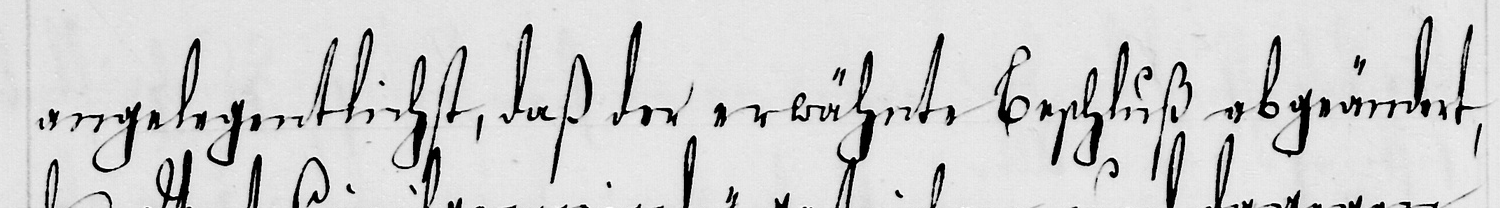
angelegentlichst, daß der erwähnte Beschluß abgeändert,
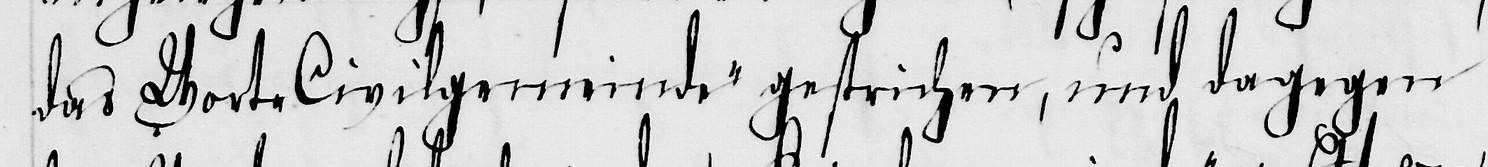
das Wort „Civilgemeinde“ gestrichen, und dagegen
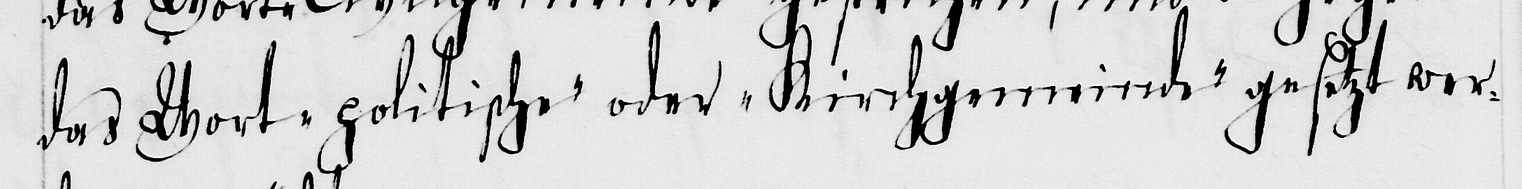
das Wort „politische“ oder „Kirchgemeinde“ gesetzt wer¬
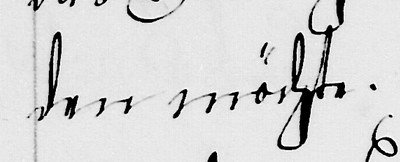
den möchte.
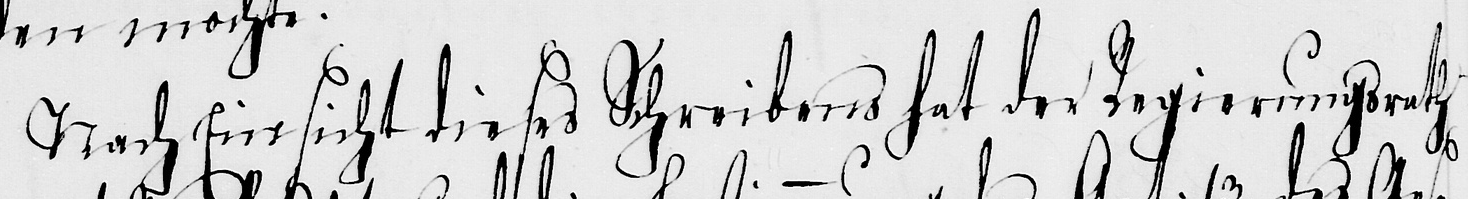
Nach Einsicht dieses Schreibens hat der Regierungsrath
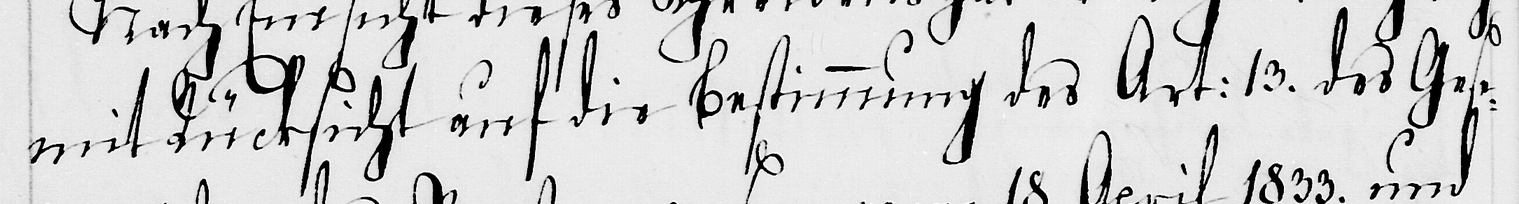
mit Rücksicht auf die Bestimmung des Art: 13. des Gese¬
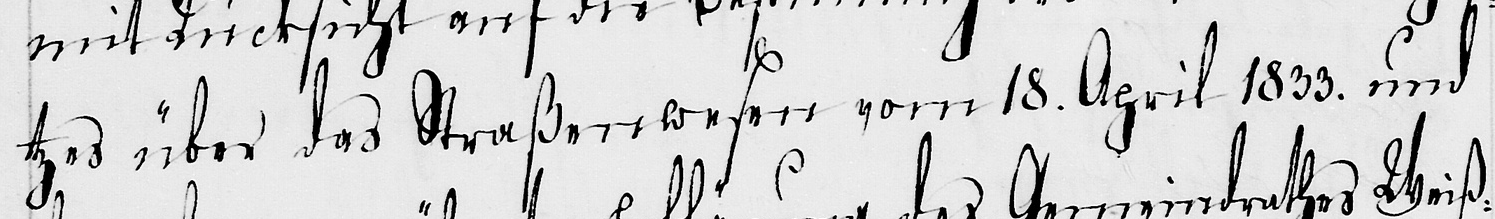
tzes über das Straßenwesen vom 18. April 1833. und
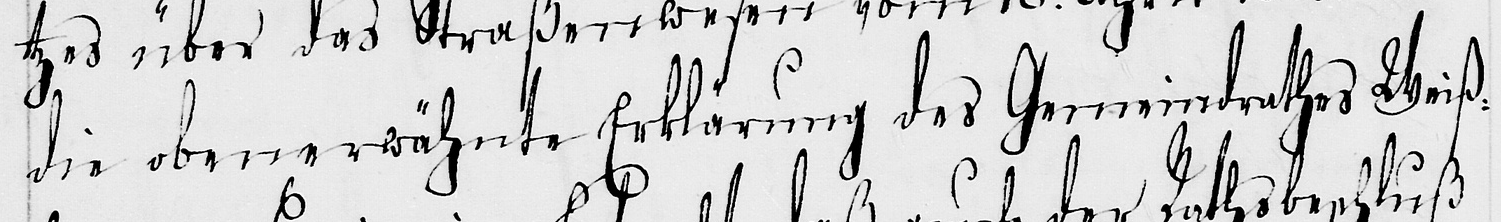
die obenerwähnte Erklärung des Gemeindrathes Weiß¬
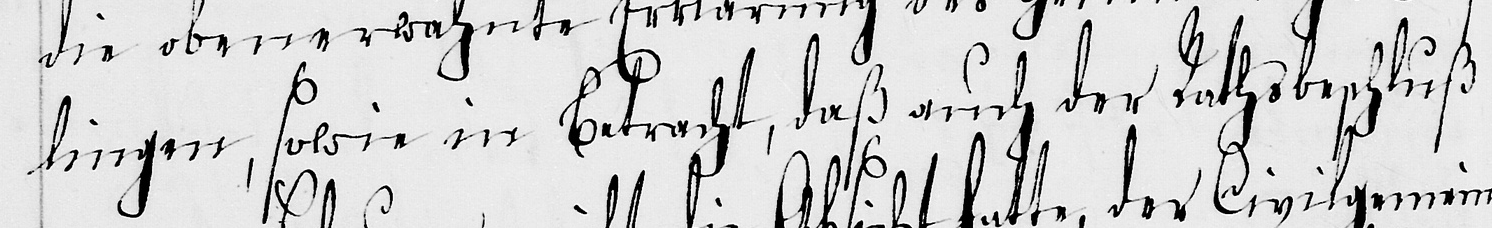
lingen, sowie in Betracht, daß auch der Rathsbeschluß
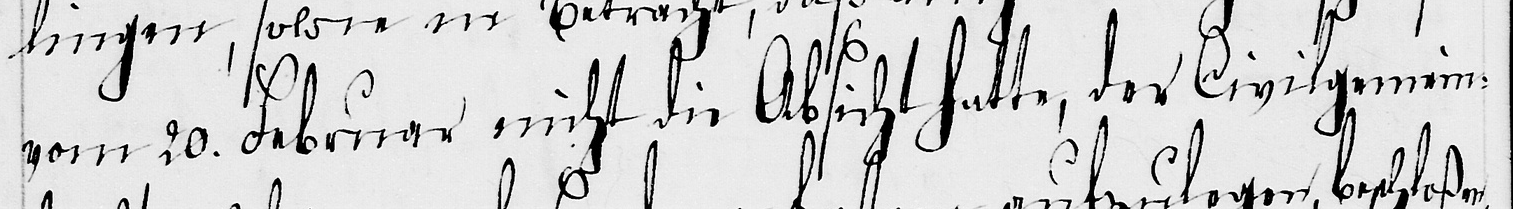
vom 20. Februar nicht die Absicht hatte, der Civilgemei¬
